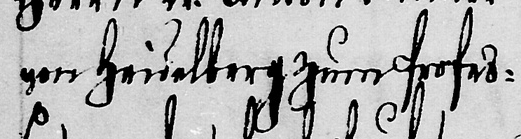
so hat der Regierungs¬
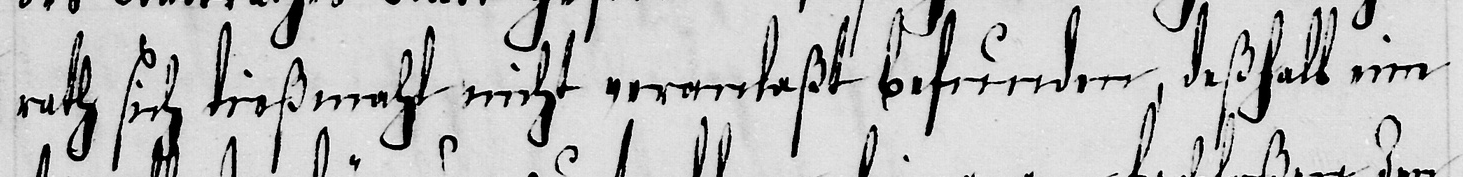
rath sich dießmahl nicht veranlaßt befunden, deßhalb eine
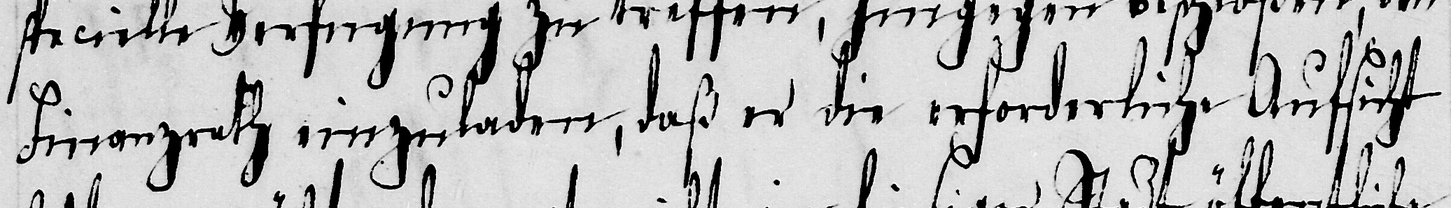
Finanzrath einzuladen, daß er die erforderliche Aufsicht
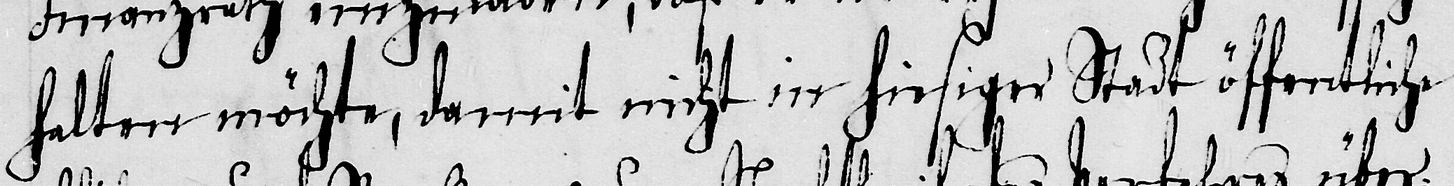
halten möchte, damit nicht in hiesiger Stadt öffentliche
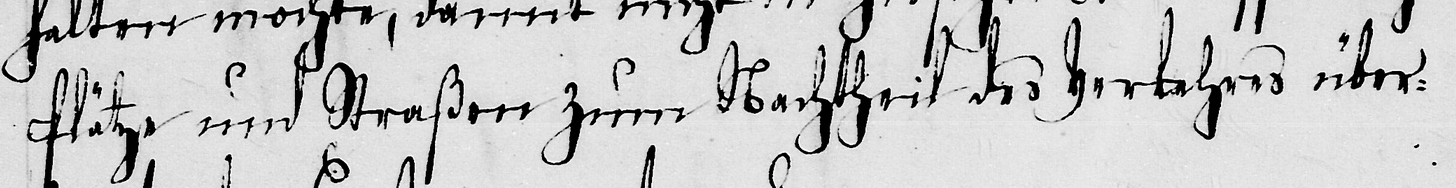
Plätze und Straßen zum Nachtheil des Verkehres über¬
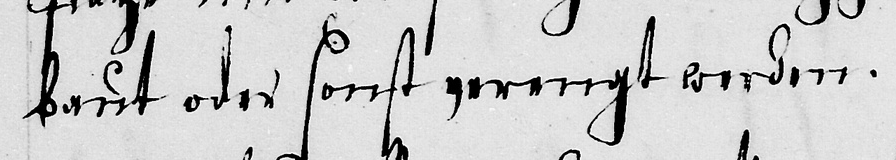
baut oder sonst verengt werden.
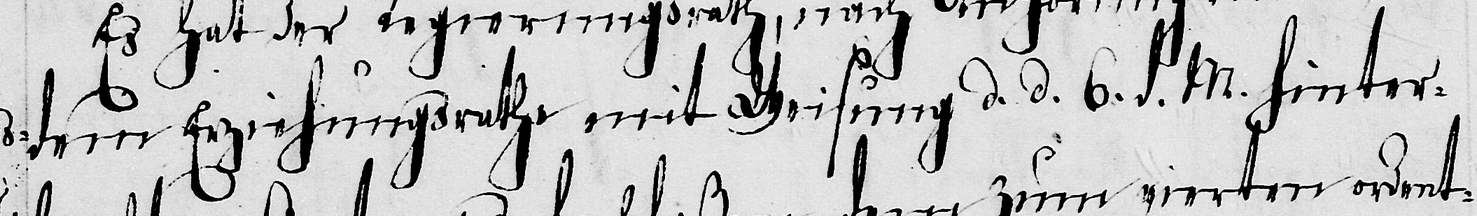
dem Erziehungsrathe mit Weisung d.d. 6. d. M. hinter¬
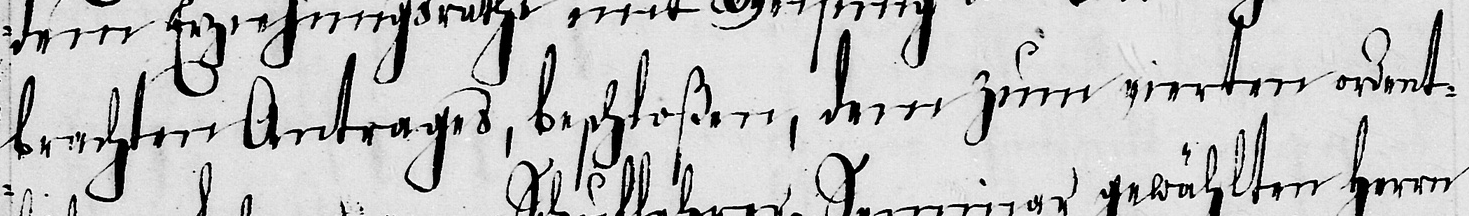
brachten Antrages, beschloßen, dem zum vierten ordent¬
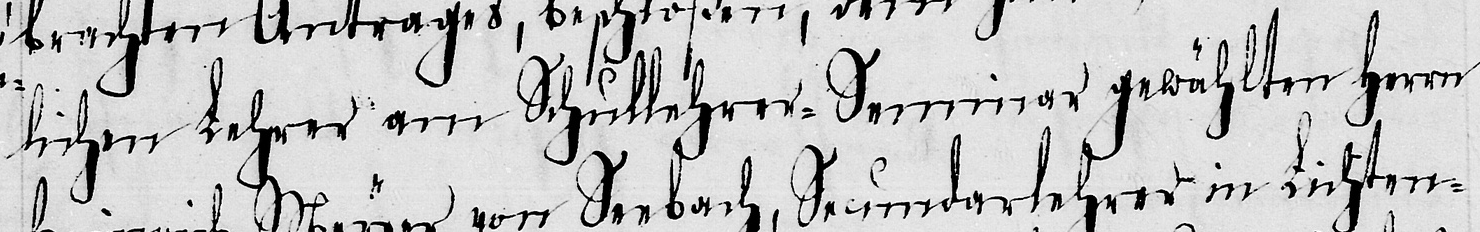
lichen Lehrer am Schullehrer-Seminar gewählten Herrn
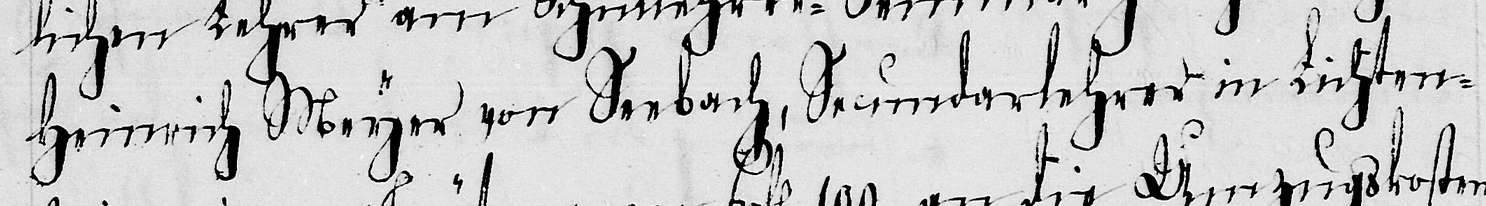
Heinrich Meyer von Seebach, Secundarlehrer in Lichten¬
